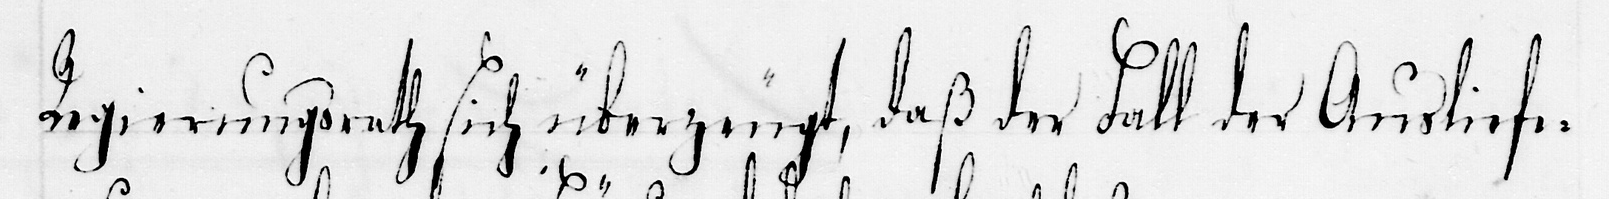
Regierungsrath sich überzeugt, daß der Fall der Auslief¬
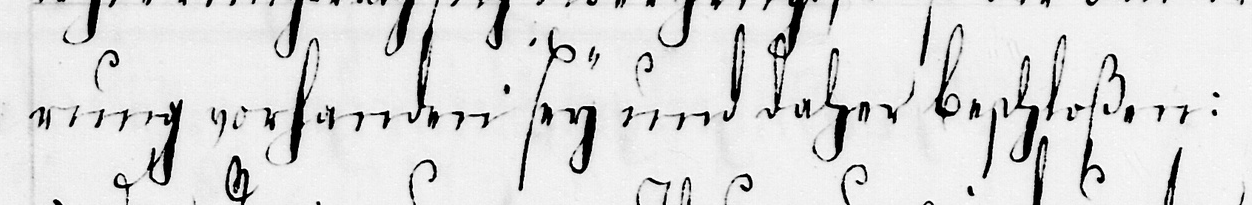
erung vorhanden sey und daher beschloßen:
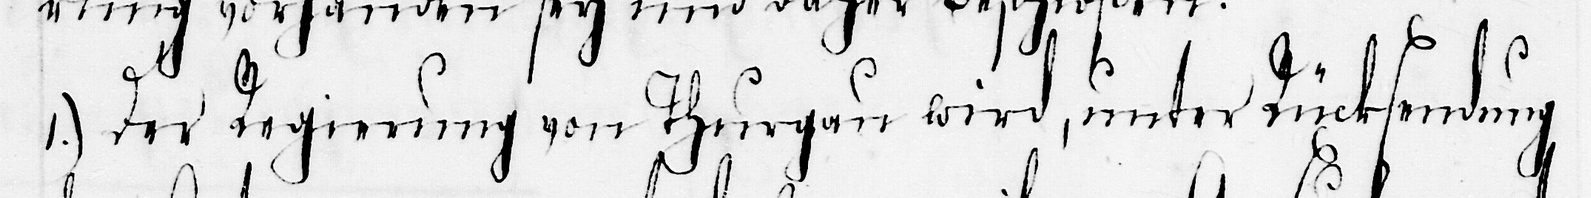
1.) Der Regierung von Thurgau wird, unter Rücksendung
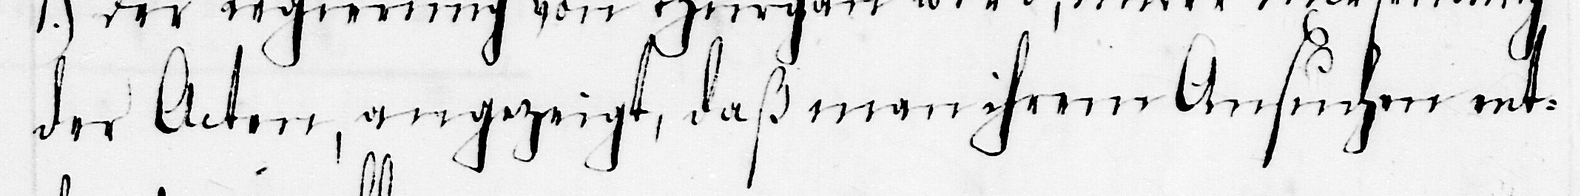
der Acten, angezeigt, daß man ihrem Ansuchen ent¬
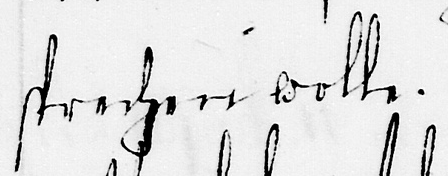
sprechen wolle.
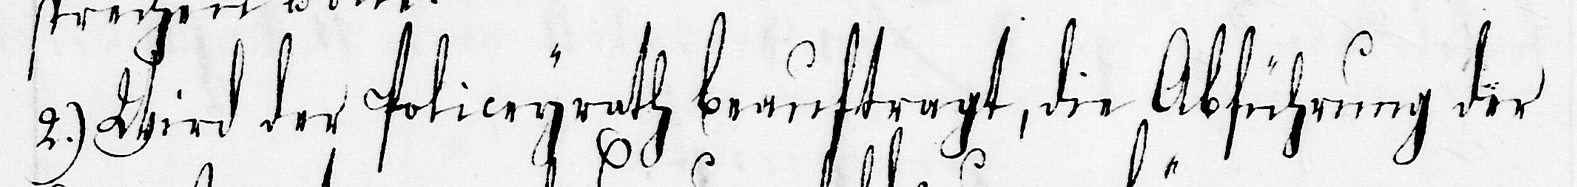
2.) Wird der Policeyrath beauftragt, die Abführung der
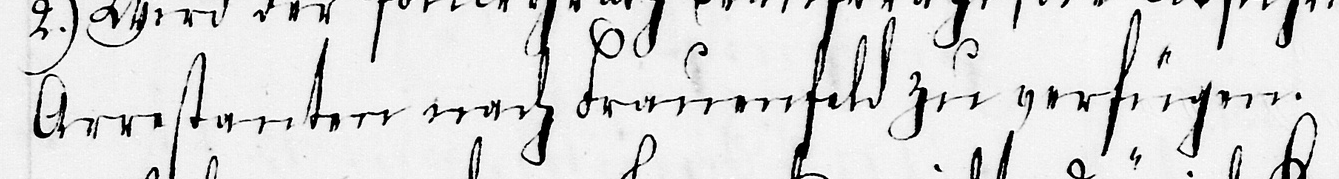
Arrestanten nach Frauenfeld zu verfügen.
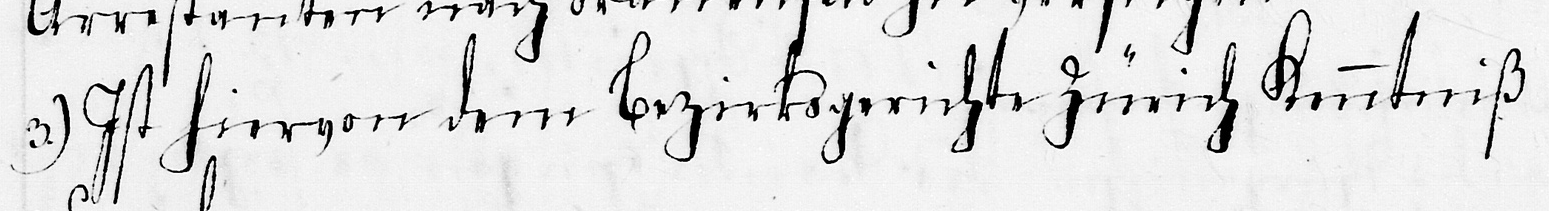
3.) Ist hiervon dem Bezirksgerichte Zürich Kenntniß
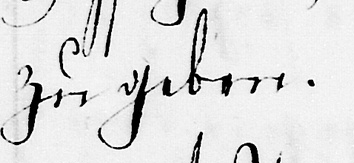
zu geben.
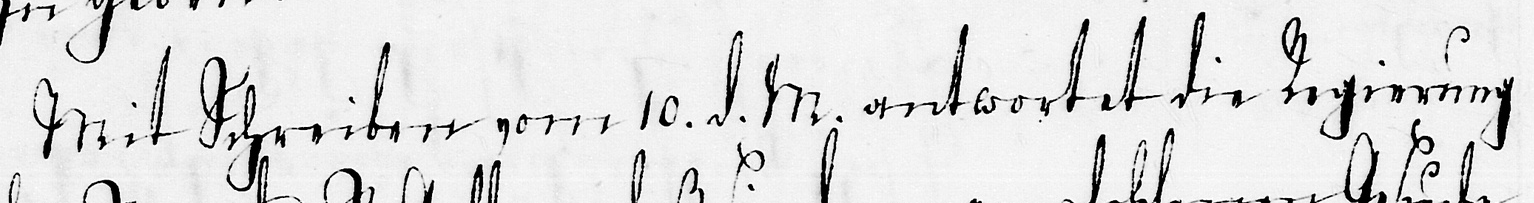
Mit Schreiben vom 10. d. M. antwortet die Regierung
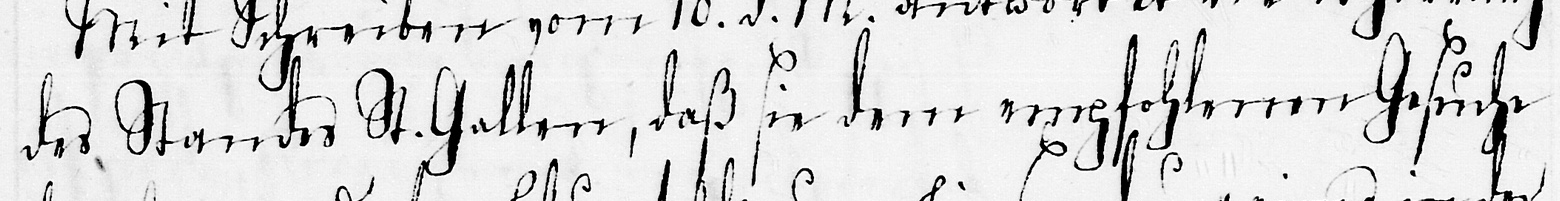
des Standes St. Gallen, daß sie dem empfohlenen Gesuche
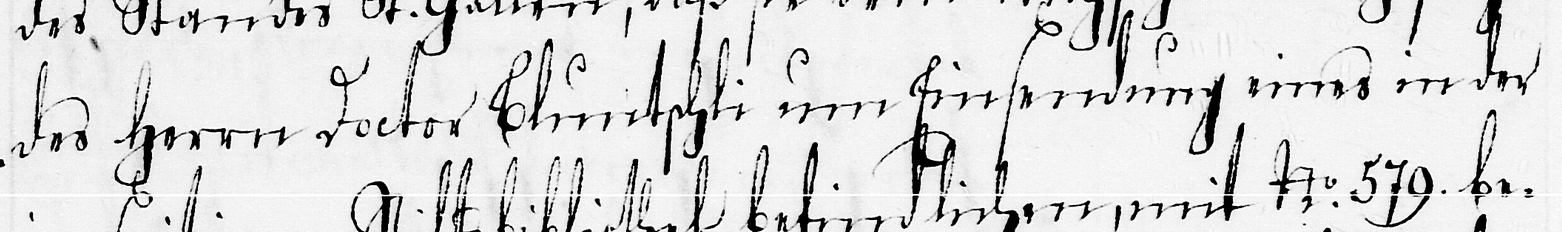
des Herrn Doctor Bluntschli um Einsendung eines in der
